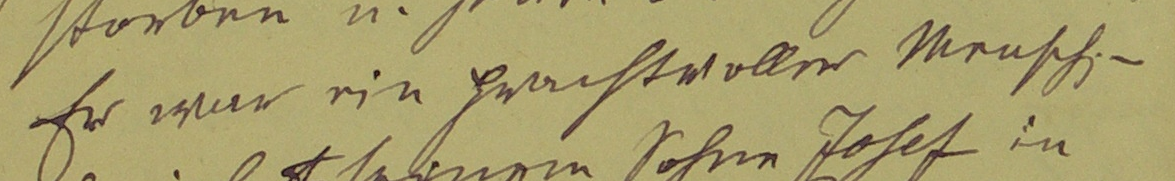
Er war ein prachtvoller Mensch,-
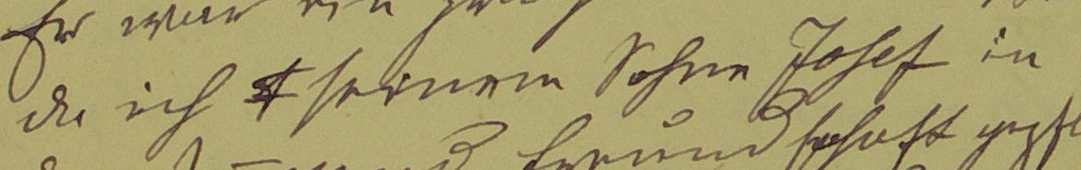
Da ich mit seinem Sohn Josef in
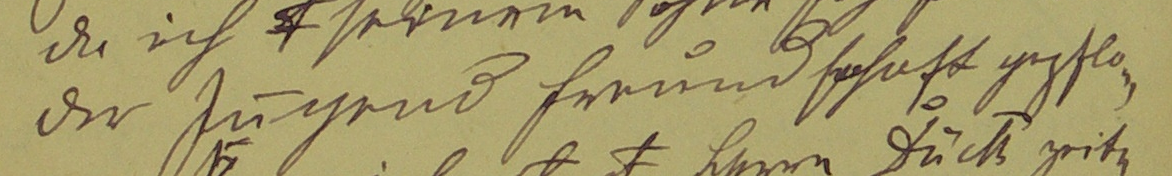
der Jugend Freundschaft gepflo¬
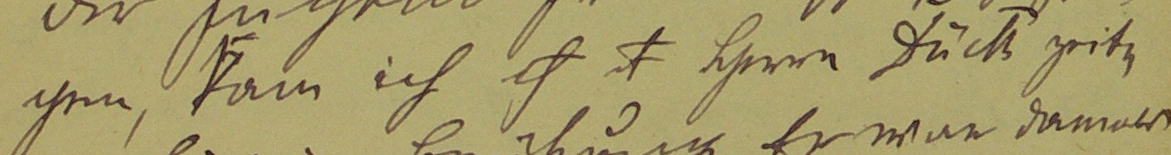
gen, kam ich auch mit Hern Dück zeit¬
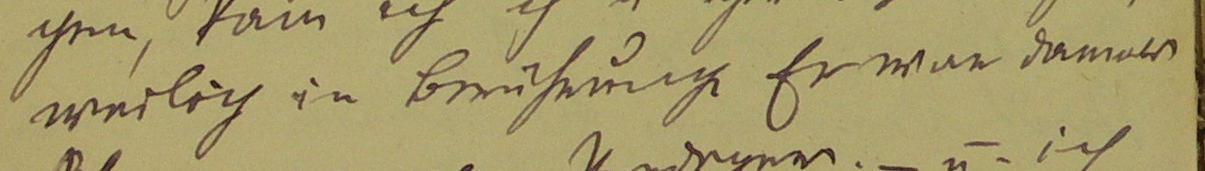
weilig in Berührung. Er war damals
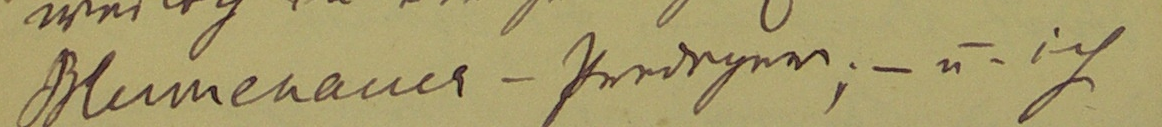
Blumenauer Prediger,- und ich
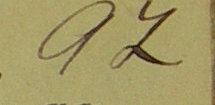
97
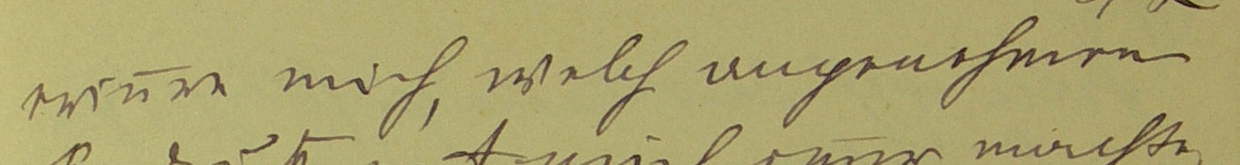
erinnere mich, welch angenehmen
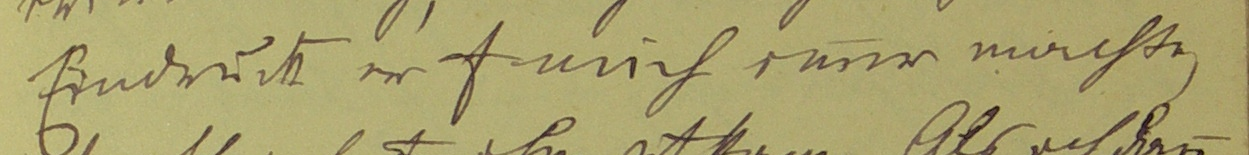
Eindruck er auf mich machte
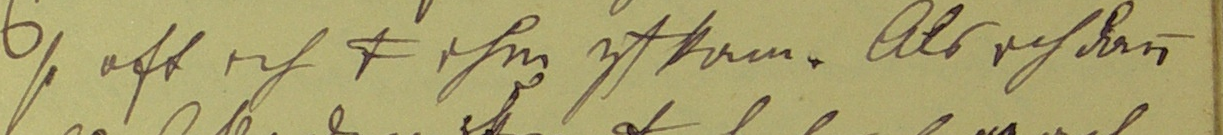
so oft ich mit ihm zusammenkam. Als ich dann
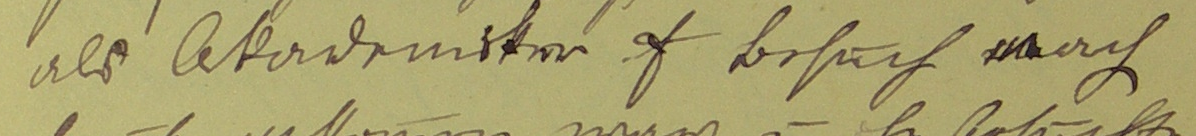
als Akademiker auf Besuch nach
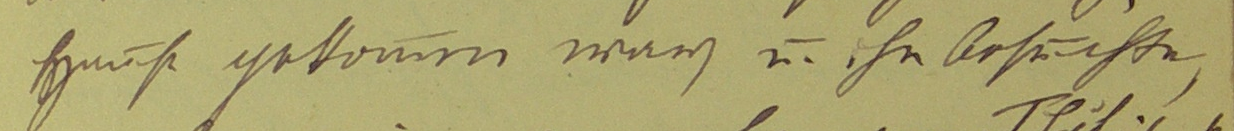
Hause gekommen war, und ihn besuchte
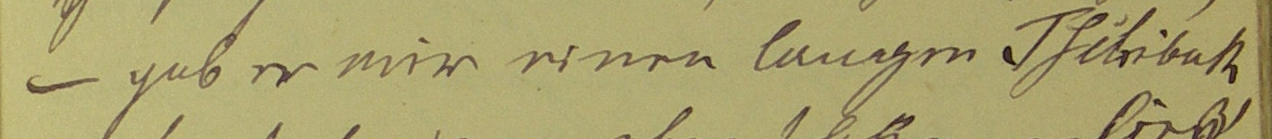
- gab er mir einen langen ?ThetBaK?
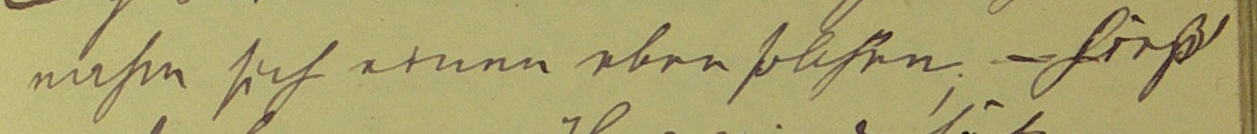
nahm sich einen ebensolchen ,-hieß
